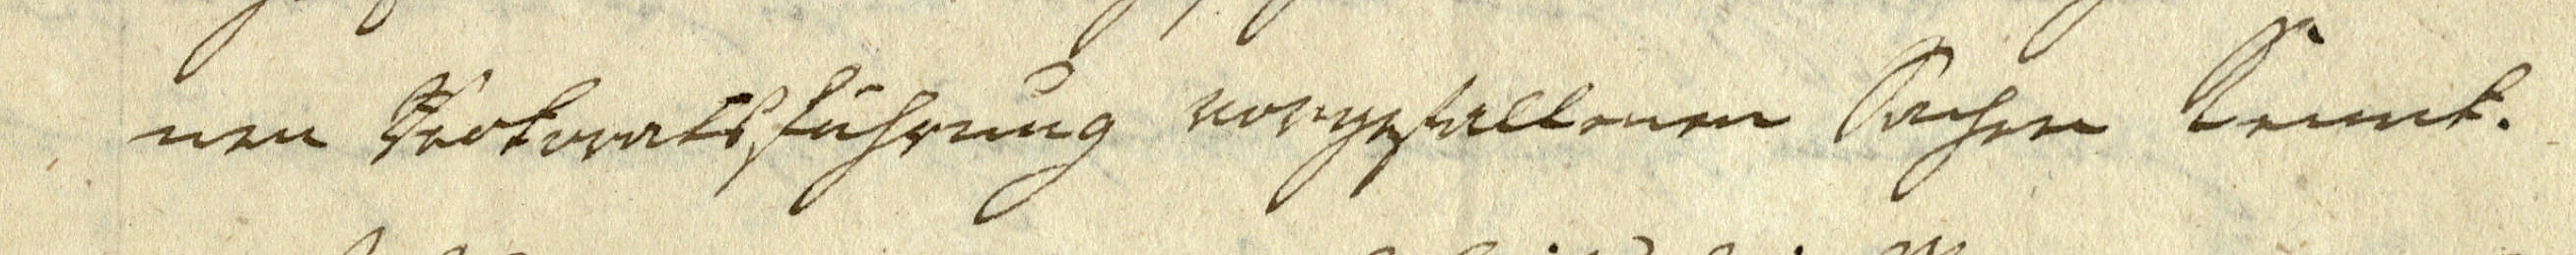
nen Rectoratsführung vorgefallenen Sachen Kennt¬
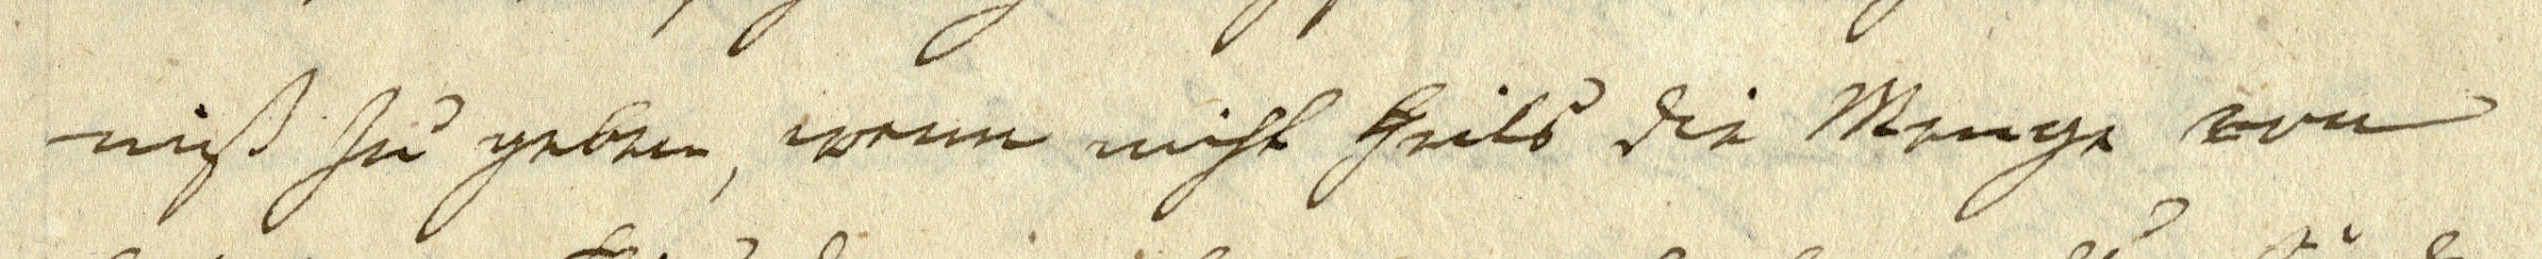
niß zu geben, wenn nicht theils die Menge von
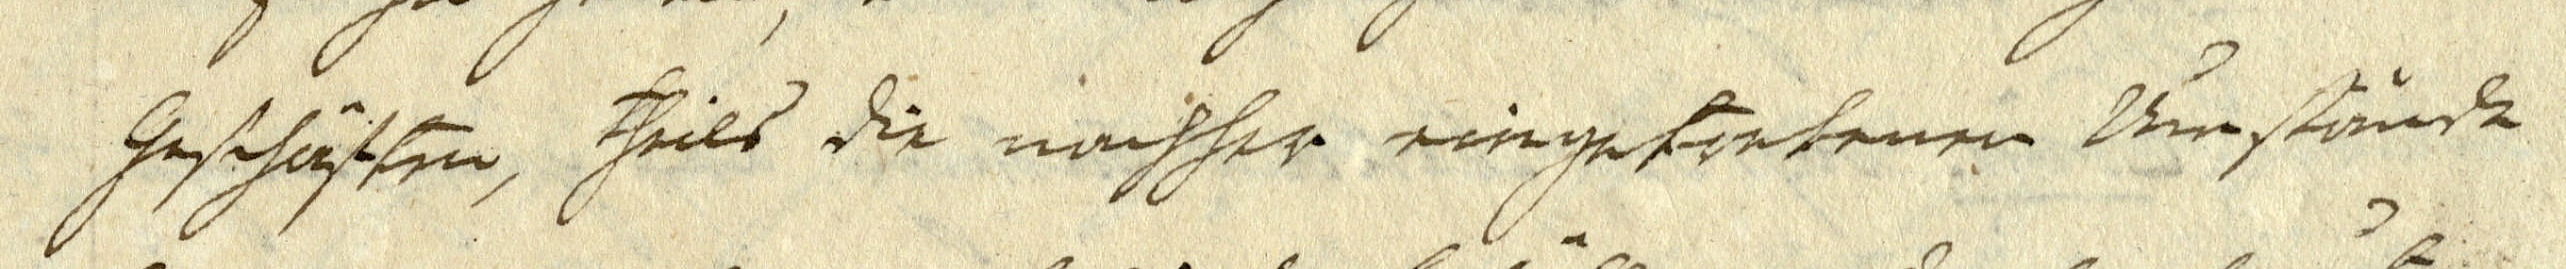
Geschäften, theils die nachher eingetretenen Umstände
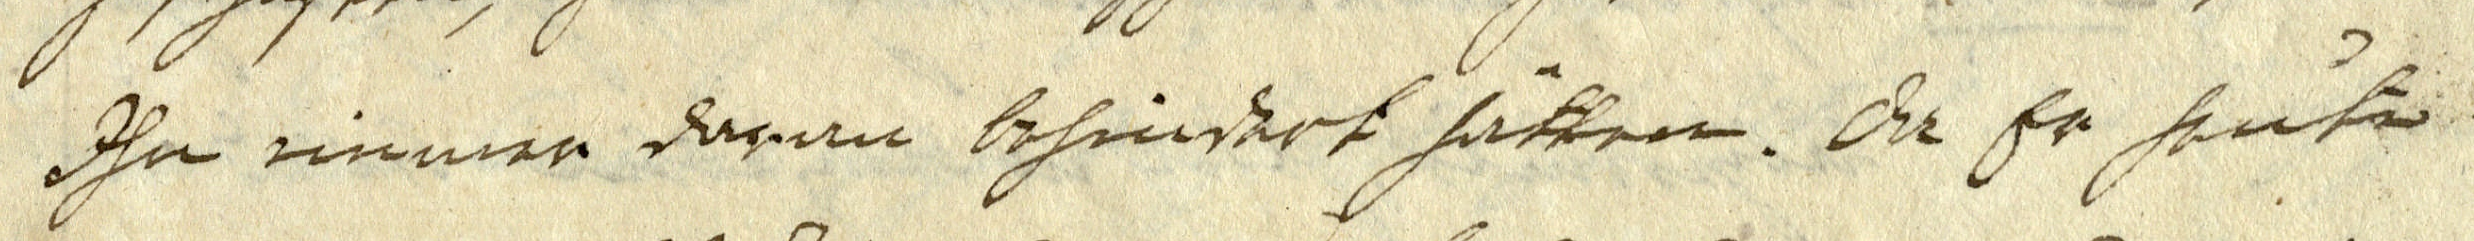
Ihn immer daran behindert hätten. Da Er heute
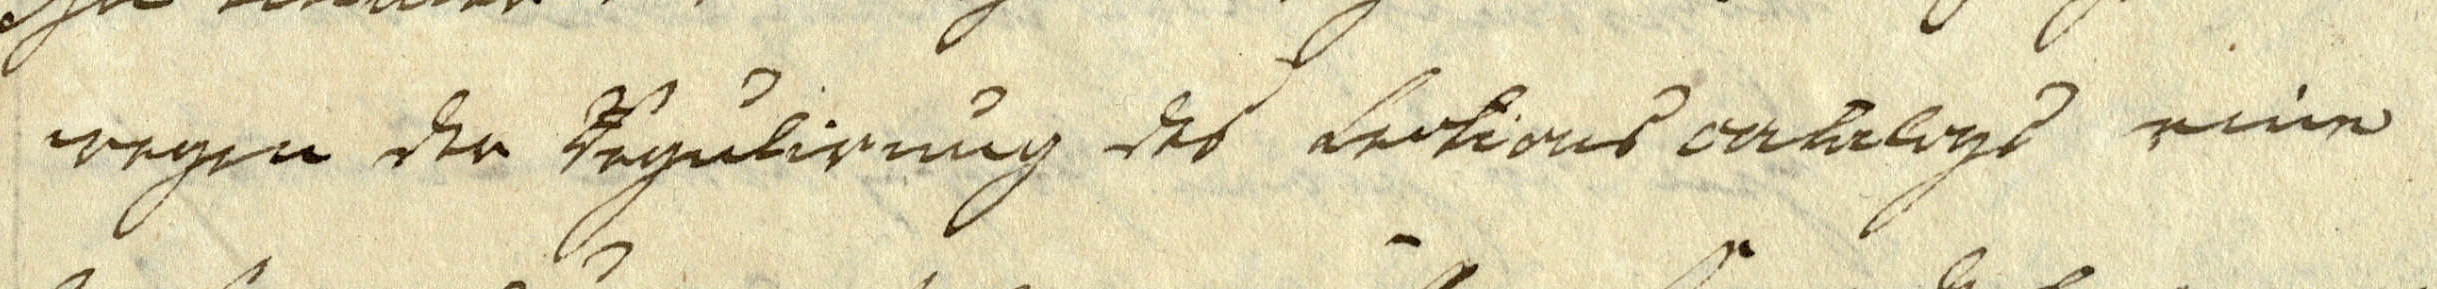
wegen der Regulirung des Lections catalogs eine
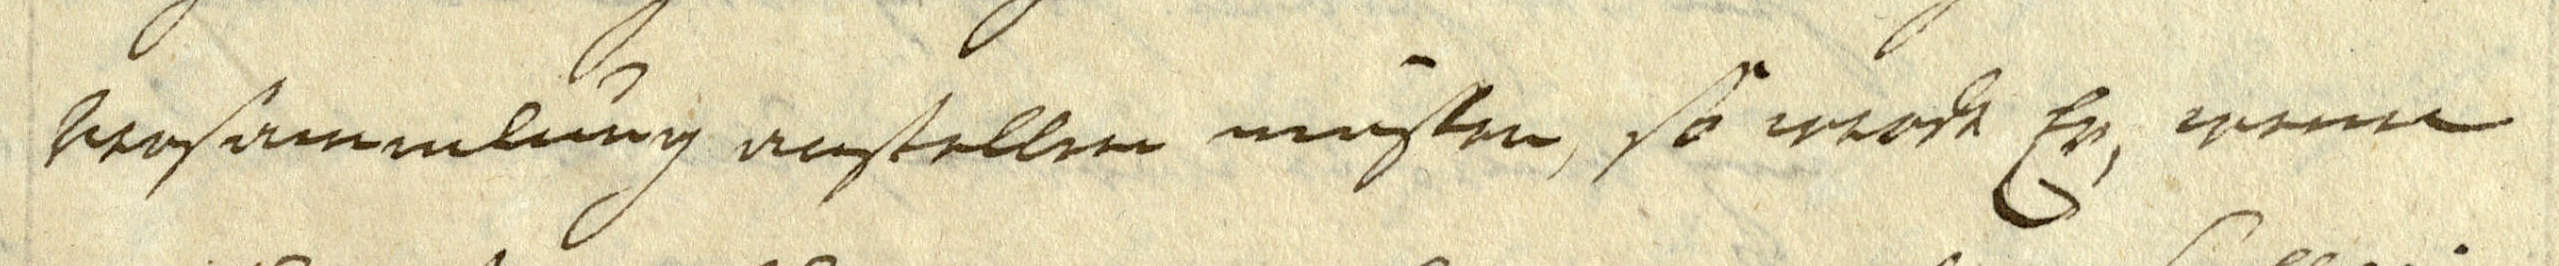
Versammlung anstellen müssen, so werde Er, wenn
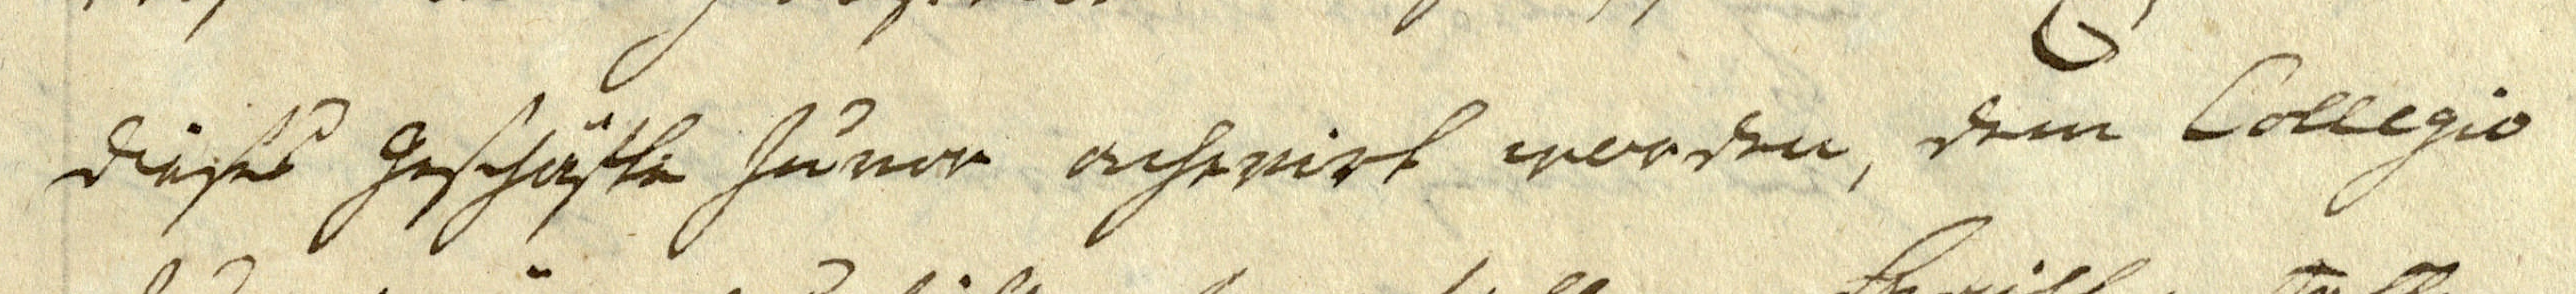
dieses Geschäfte zuvor achevirt worden, dem Collegio
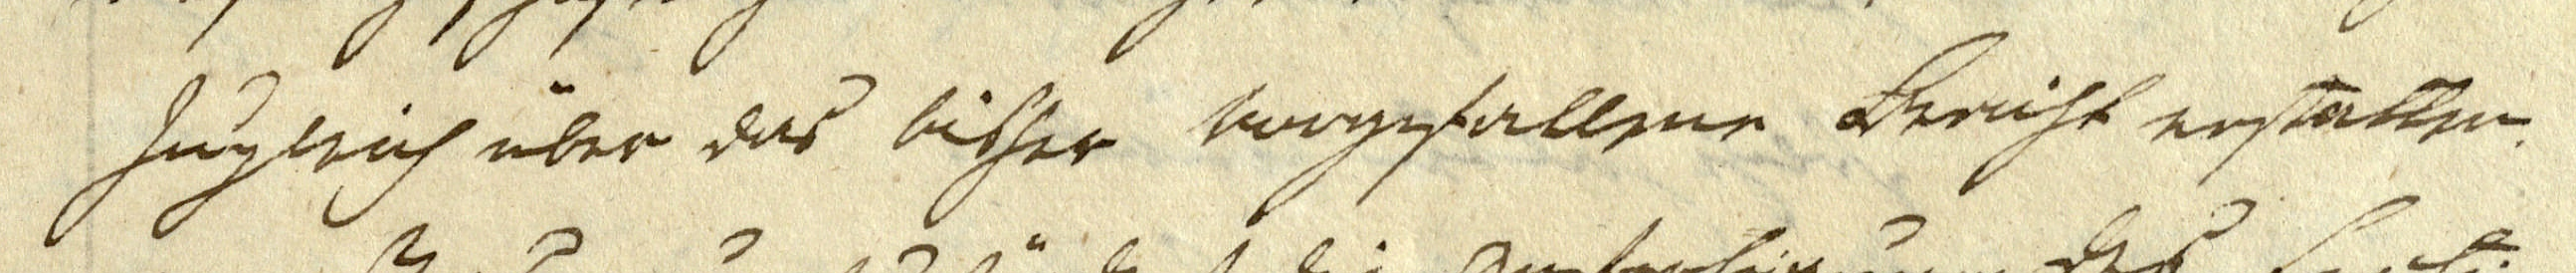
zugleich über das bisher vorgefallene Bericht erstatten.
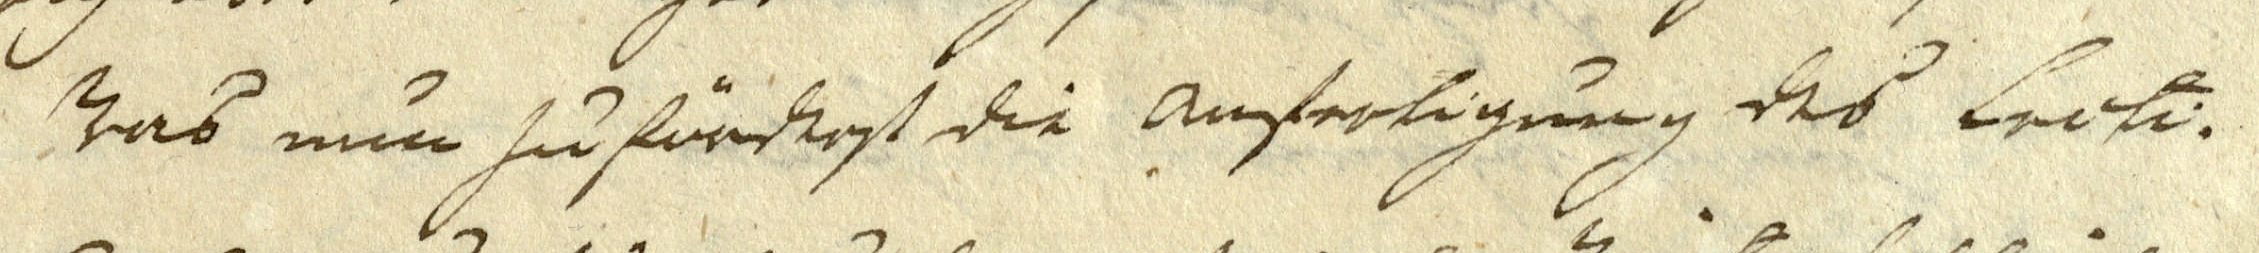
Was nun zuförderst die Anfertigung des Lecti¬
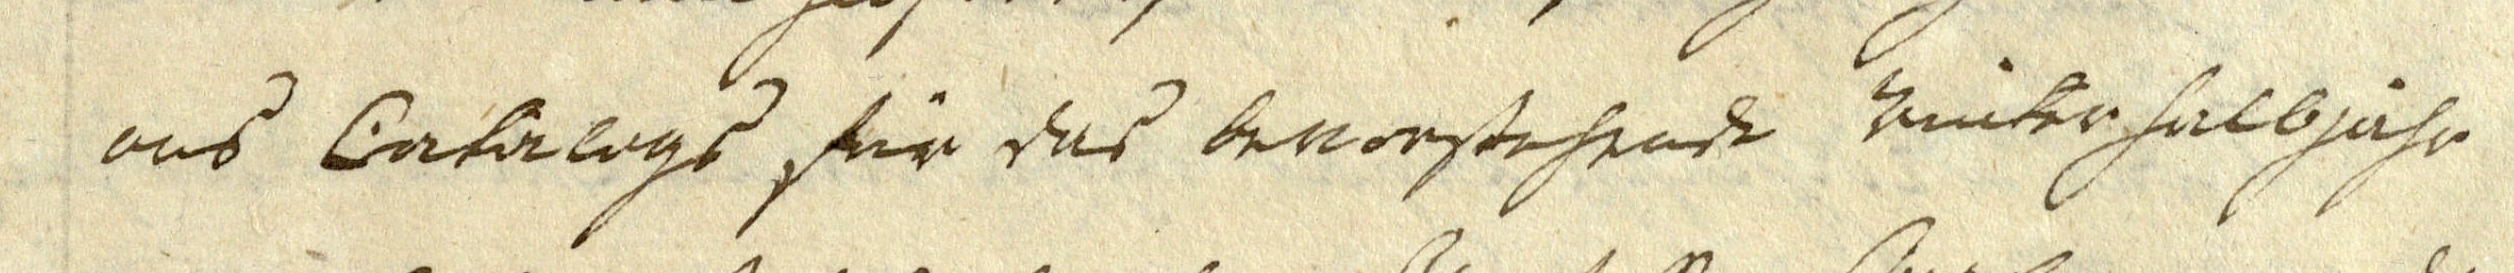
ons Catalogs für das bevorstehende Winterhalbjahr
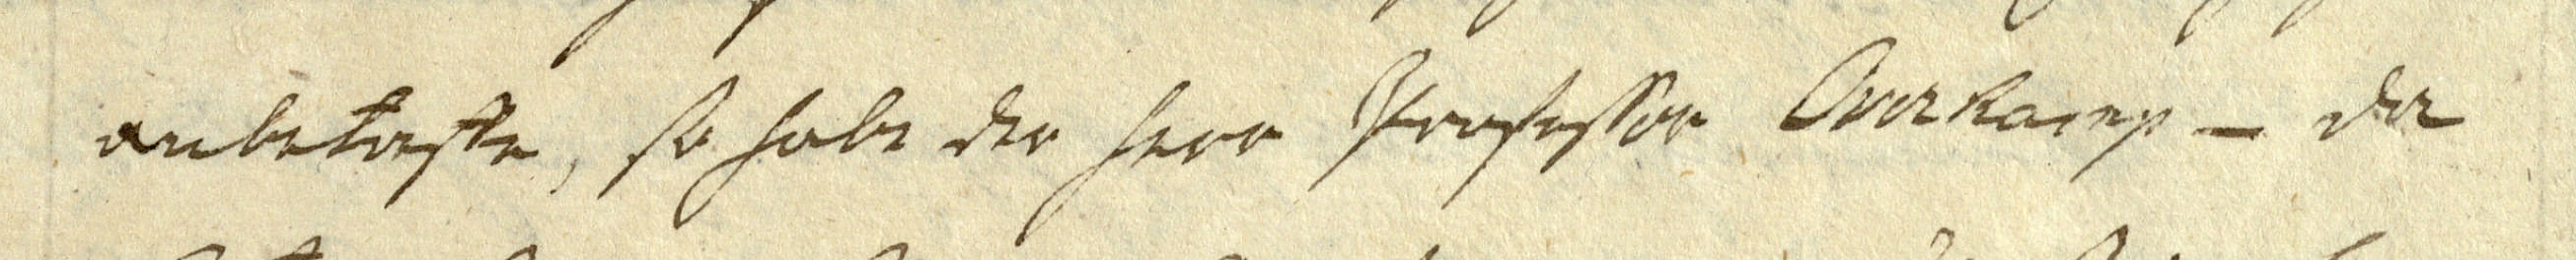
anbetreffe, so habe der Herr Professor Overkamp - da
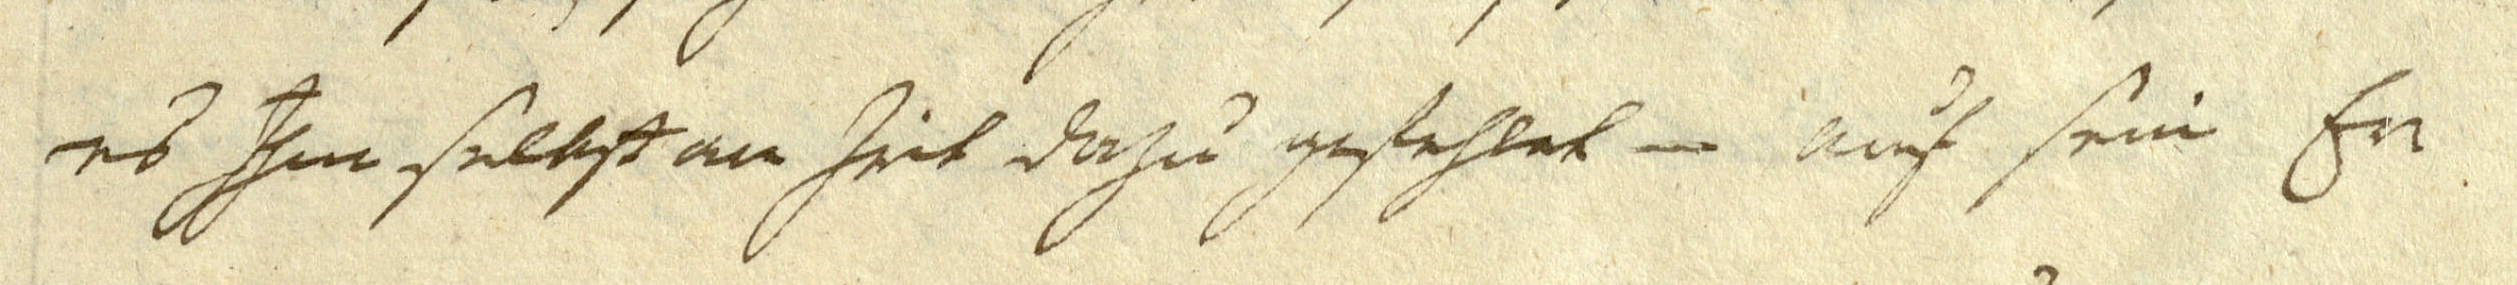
es Ihm selbst an Zeit dazu gefehlet - auf sein Er¬
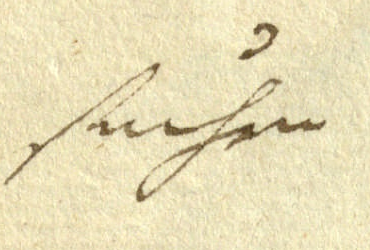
suchen
